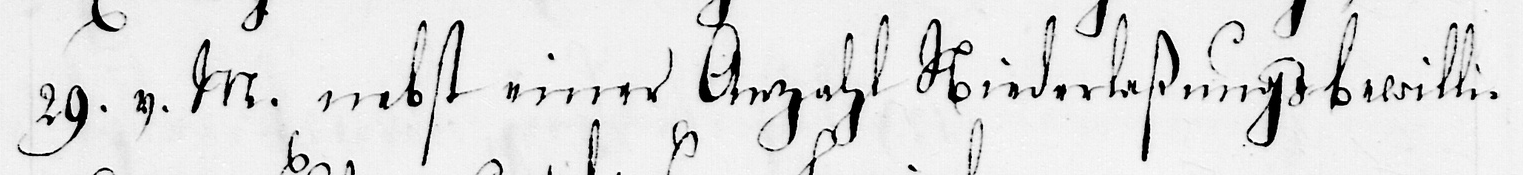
29. v. M. nebst einer Anzahl Niederlaßungsbewilli¬
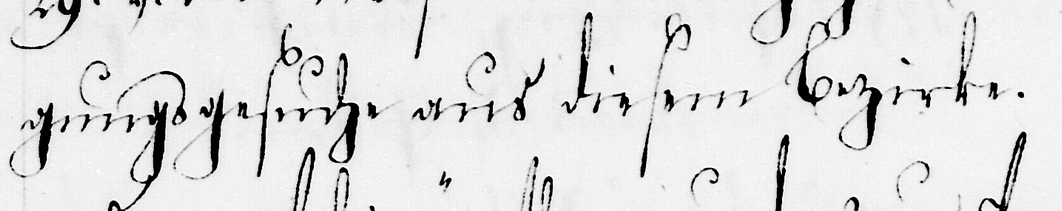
gungsgesuche aus diesem Bezirke.
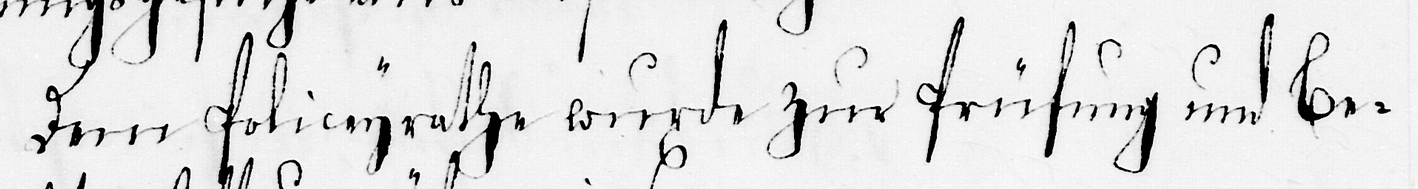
Dem Policeyrathe wurde zur Prüfung und Be¬
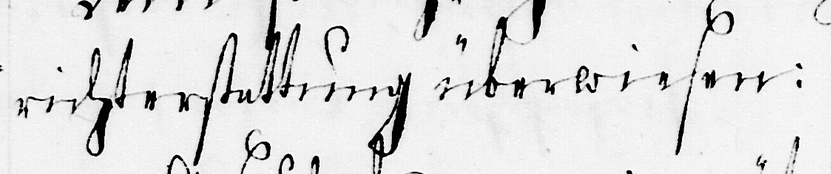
richterstattung überwiesen:
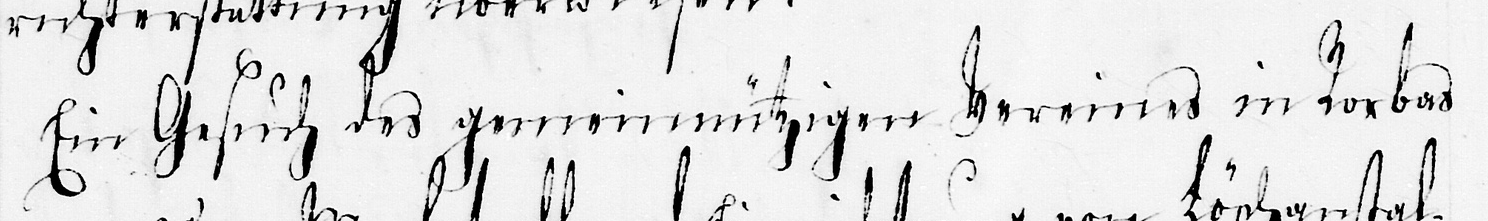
Ein Gesuch des gemeinnützigen Vereines in Rorbas
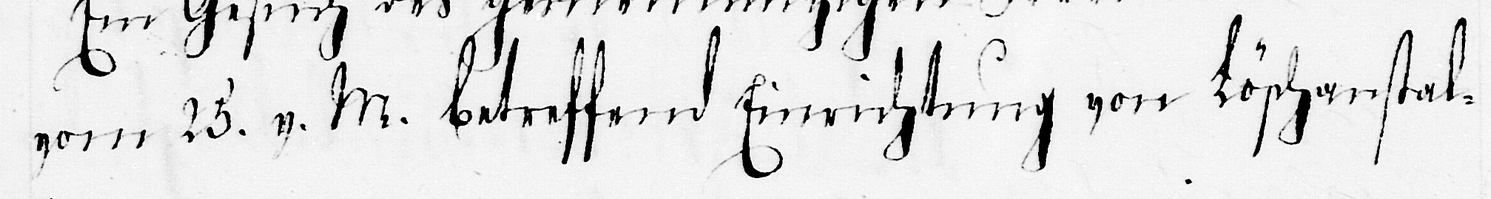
vom 25. v. M. betreffend Einrichtung von Löschanstal¬
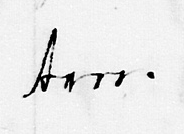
ten.
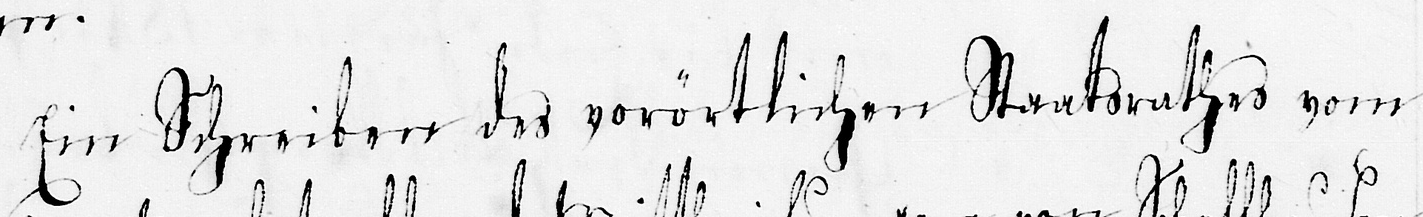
Ein Schreiben des vorörtlichen Staatsrathes vom
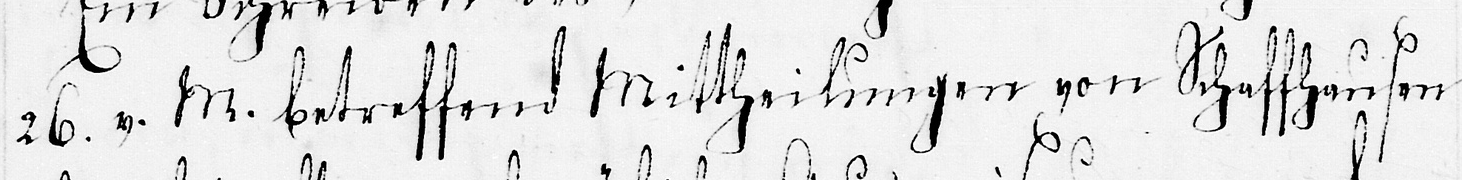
26. v. M. betreffend Mittheilungen von Schaffhausen
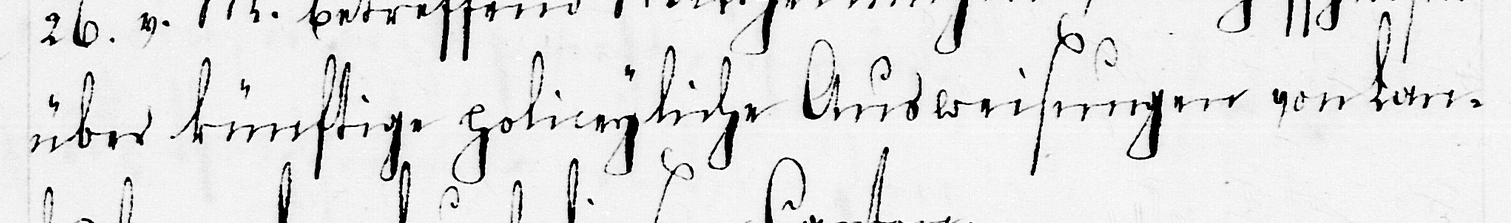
über künftige policeyliche Ausweisungen von Lan¬
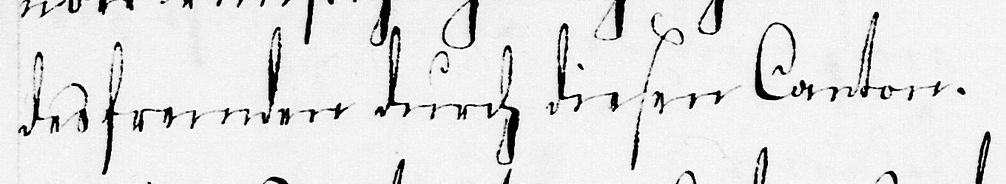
desfremden durch diesen Canton.
